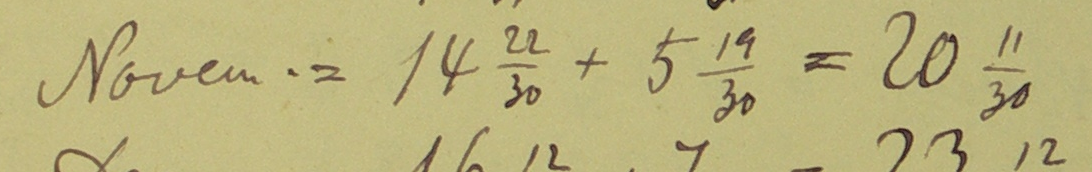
Novem. = 14 22/30 + 5 19/30 = 20 12/30
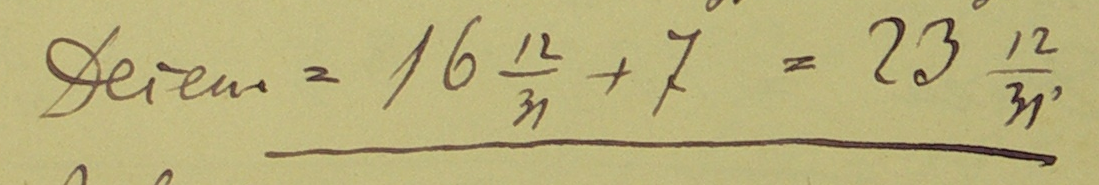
Decem. = 16 12/31 + 7 = 23 12/31
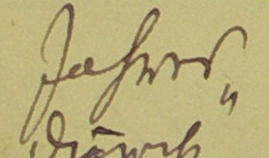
Jahres¬
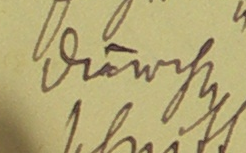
durch¬
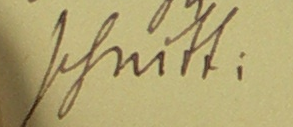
schnitt:
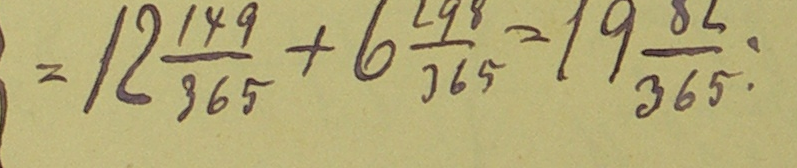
= 12 149/365 * 6 298/365 = 19 82/365
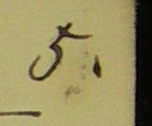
5
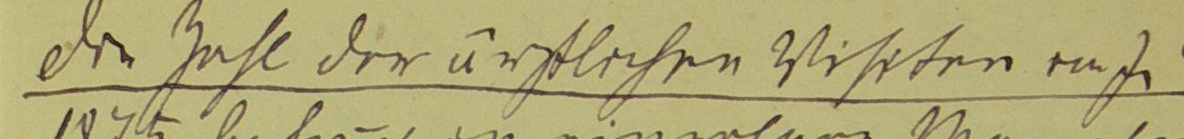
Die Zahl der ärztlichen Visiten im J.
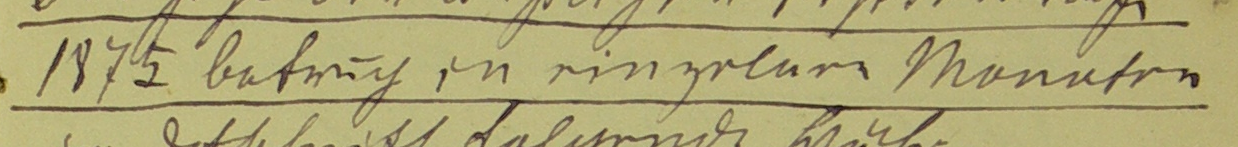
1875 betrug in einzelnen Monaten
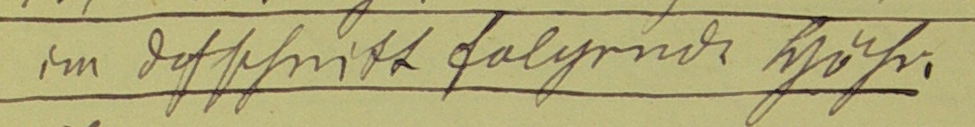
im Durchschnitt folgende Höhe:
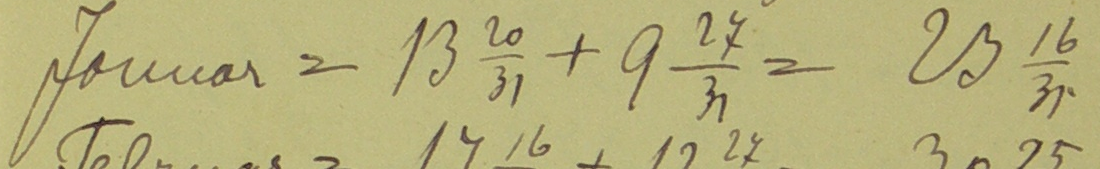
Januar = 13 20/31 + 9 27/31 = 23 16/31
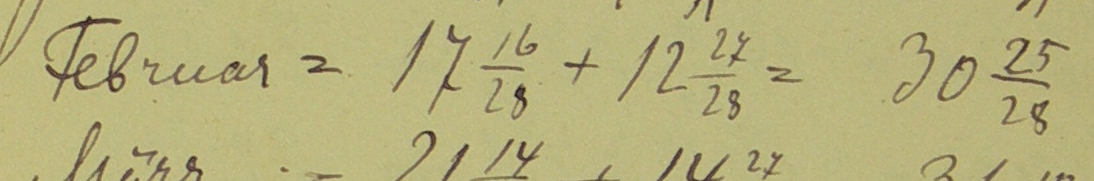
Februar = 17 16/28 + 12 27/28 = 30 25/28
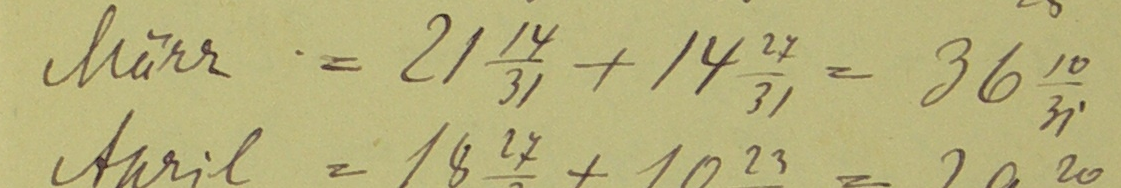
März = 21 14/31 + 14 27/31 = 36 10/ 31
